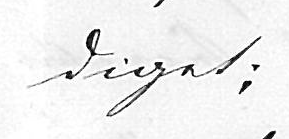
diget;
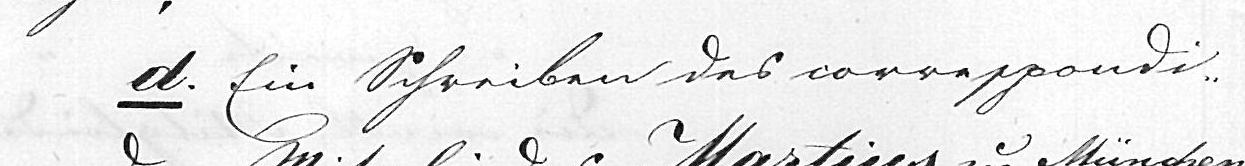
d. Ein Schreiben des correspondi-
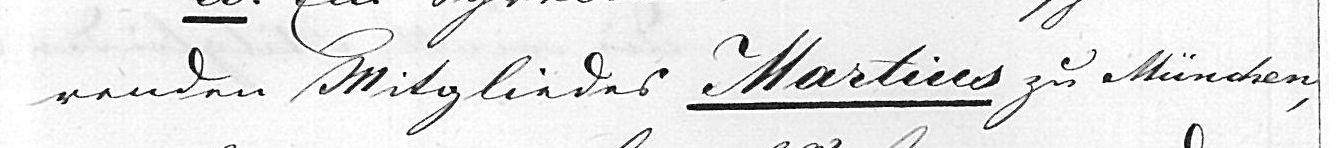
renden Mitgliedes Martius zu München,
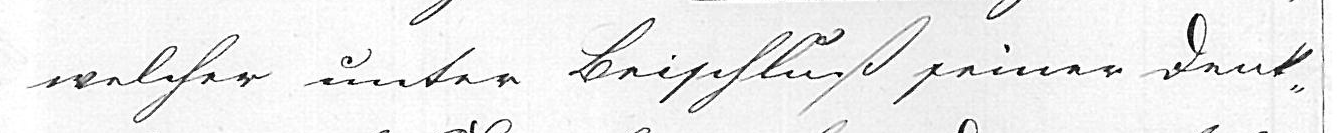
welcher unter Beischluß seiner Denk-
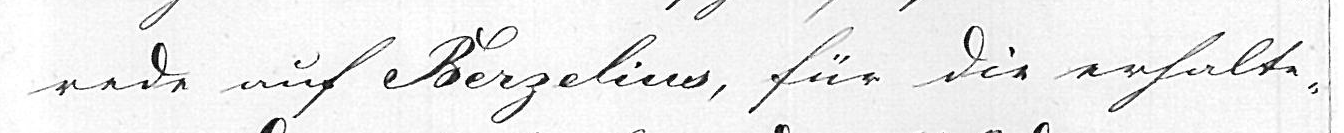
rede auf Berzelius, für die erhalte-
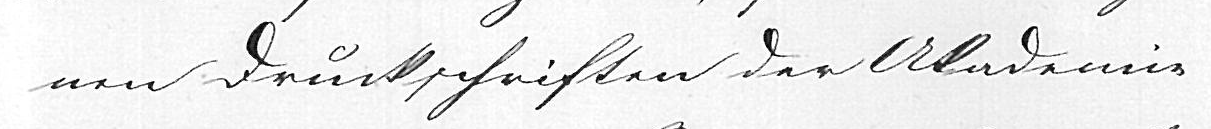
nen Druckschriften der Akademie
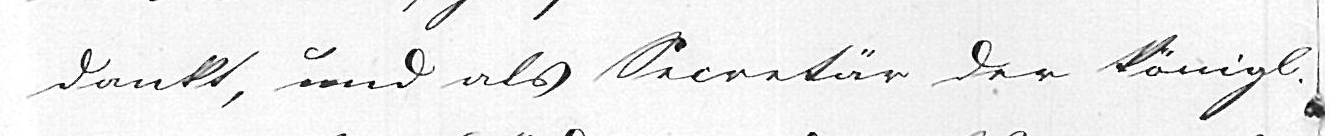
dankt, und als Secretär der königl.
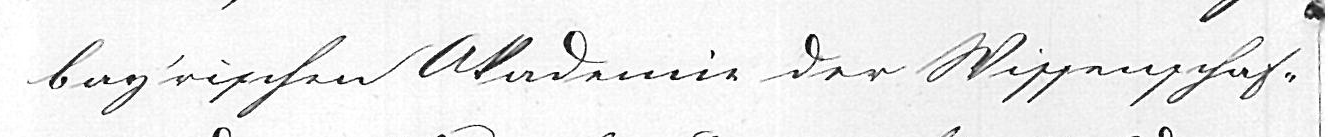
bayrischen Akademie der Wissenschaf-
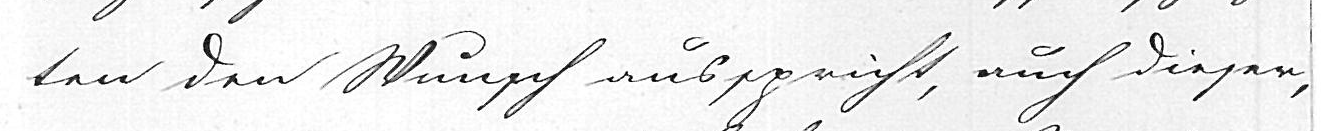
ten den Wunsch ausspricht, auch dieser,
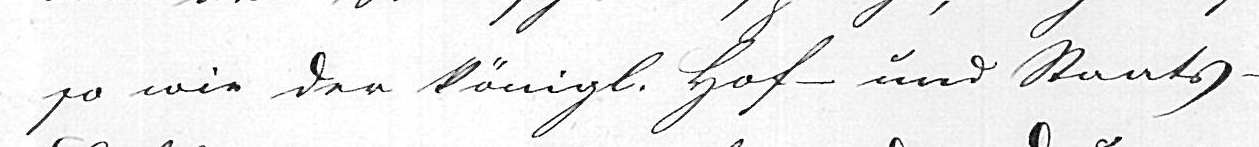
so wie der königl. Hof- und Staats-
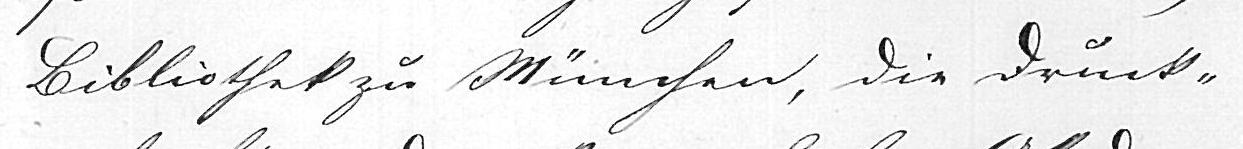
Bibliothek zu München, die Druck-
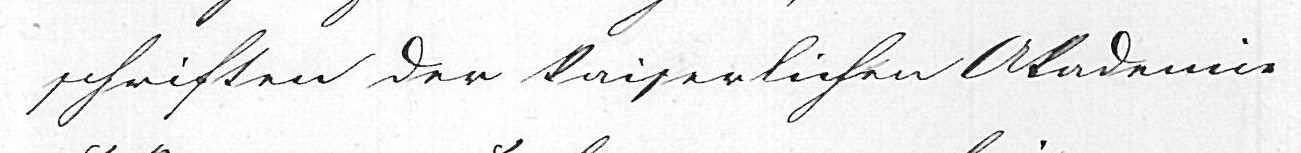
schriften der kaiserlichen Akademie
